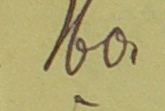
160
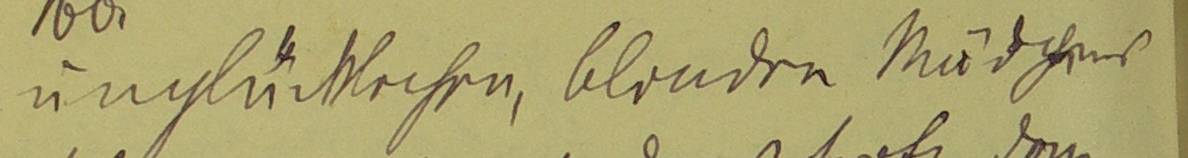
unglücklichen , blonden Mädchens
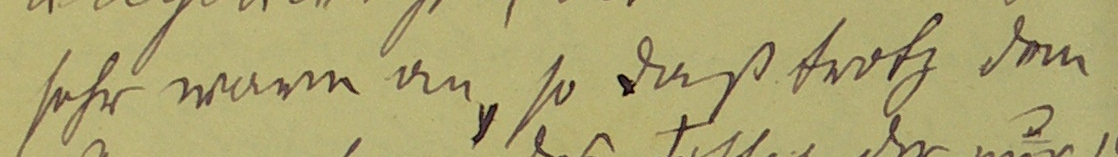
sehr warm an, so daß trotz dem
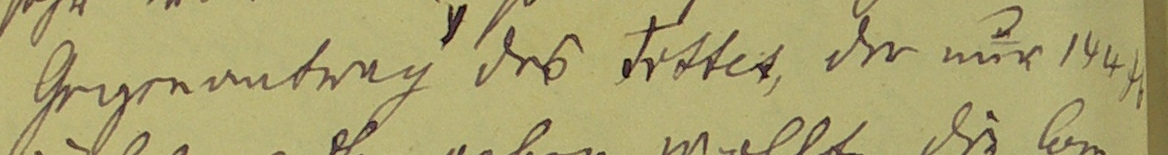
Gegenantrag des Tittes , der nur 144 Fl.
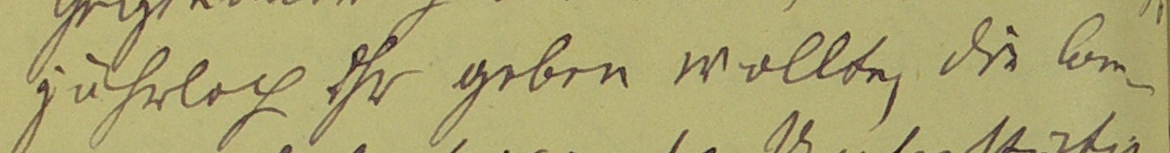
jährlich ihr geben wollte, die Com¬
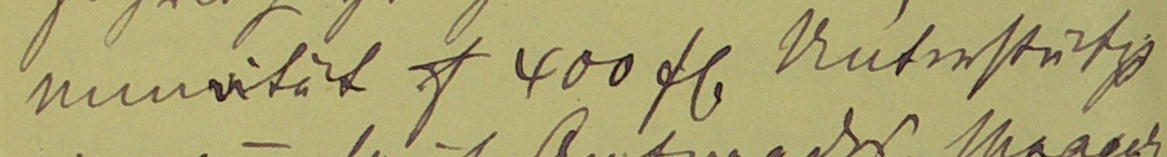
munität mit 400 Fl Unterstützung
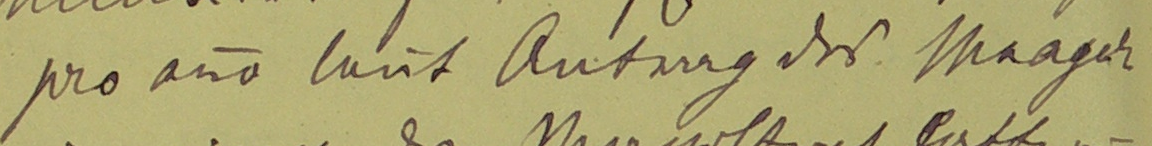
pro anno laut Antrag des Maager
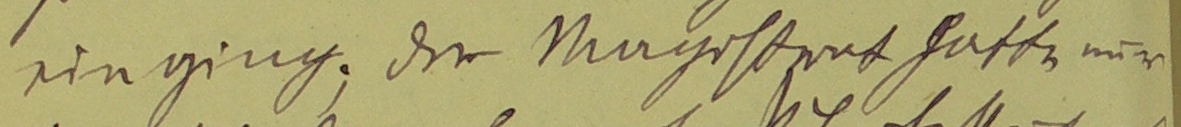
einging;- der Magistrat hatte nur
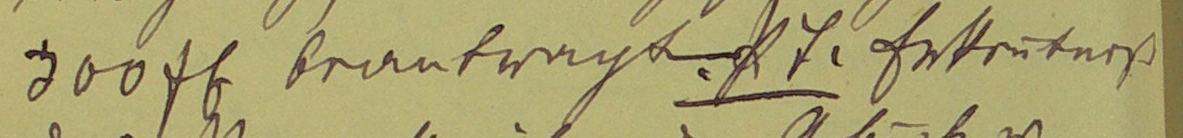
300 Fl beantragt. P. 7. Erkenntnis
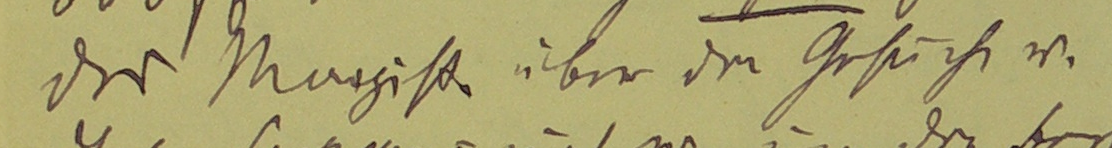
des ?Magistrats über die Gesuch von
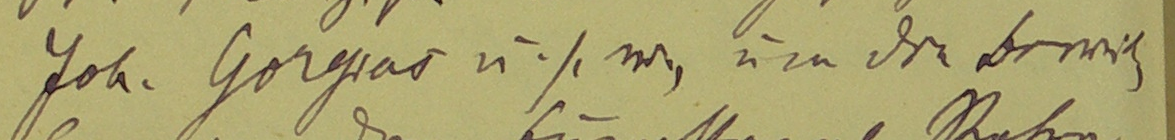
Joh. Gorges u.s.w. um den Beweis¬
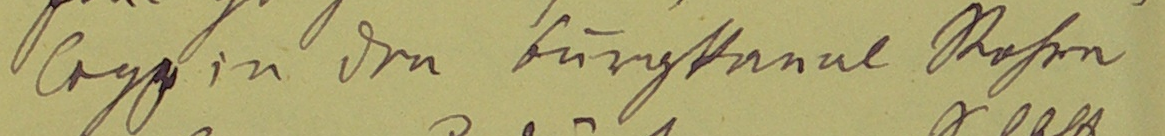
lage in den Burgkanal Rohre
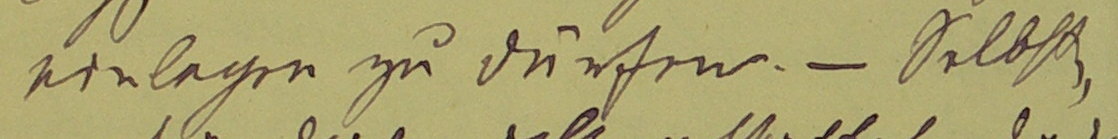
einlagern zu dürfen.—Selbst¬
